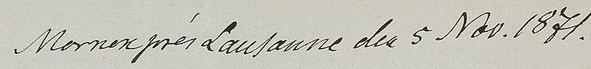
Mornex prés Lausanne den 5 Nov. 1871.
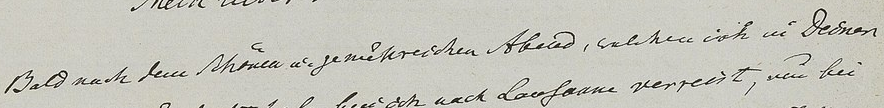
Bald nach dem schönen u. genussreichen Abend, welchen ich in Deiner
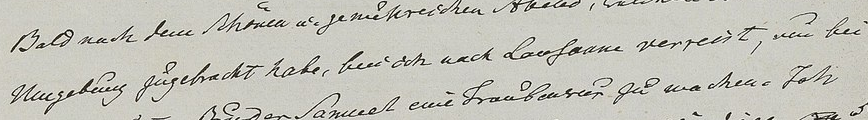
Umgebung zugebracht habe, bin ich nach Lausanne verreist, um bei
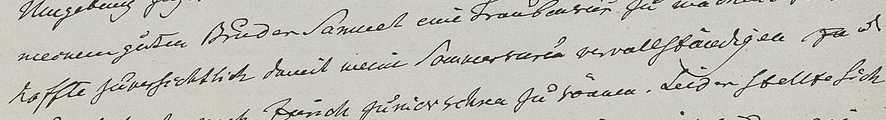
hoffte zuversichtlich damit meine Sommerkuren vervollständigen zu u.
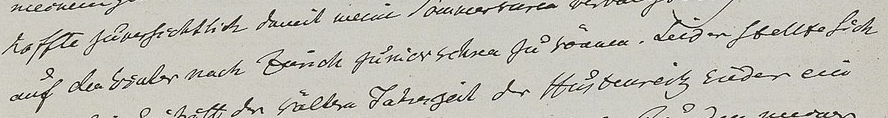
auf den Winter nach Zürich zurückkehren zu können. Leider stellte sich
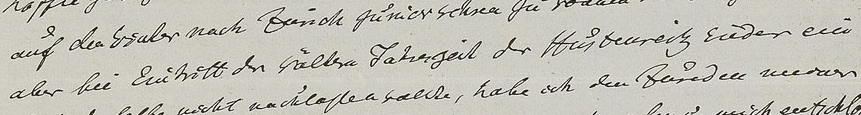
aber bei Eintritt der kältern Jahreszeit der Hustenreitz wieder ein
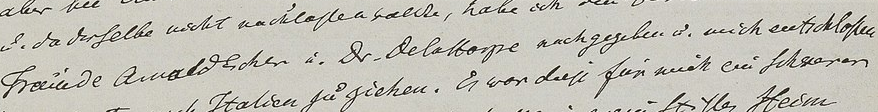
Freunde Arnold Escher u. Dr. DelaHarpe nachgegeben u. mich entschlossen
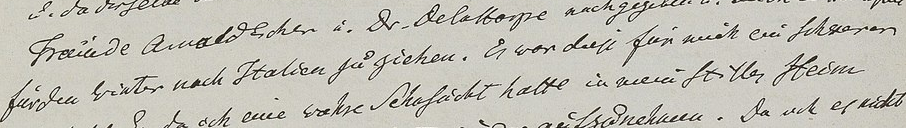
für den Winter nach Italien zu ziehen. Es war diess für mich ein schwerer
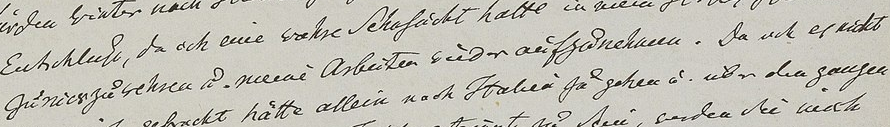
zurückzukehren u. meine Arbeiten wieder aufzunehmen. Da ich es nicht
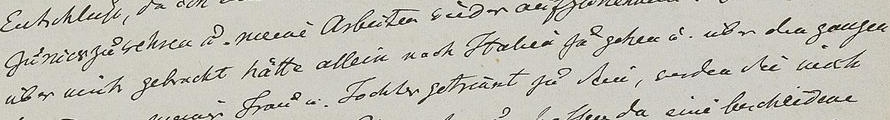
über mich gebracht hätte allein nach Italien zu gehen u. über den ganzen
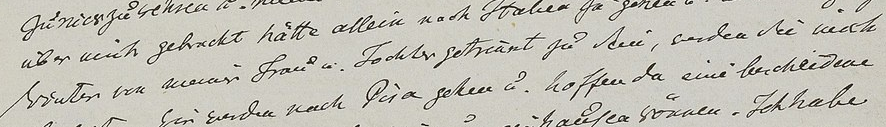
Winter von meiner Frau u. Tochter getrennt zu sein, werden sie mich
